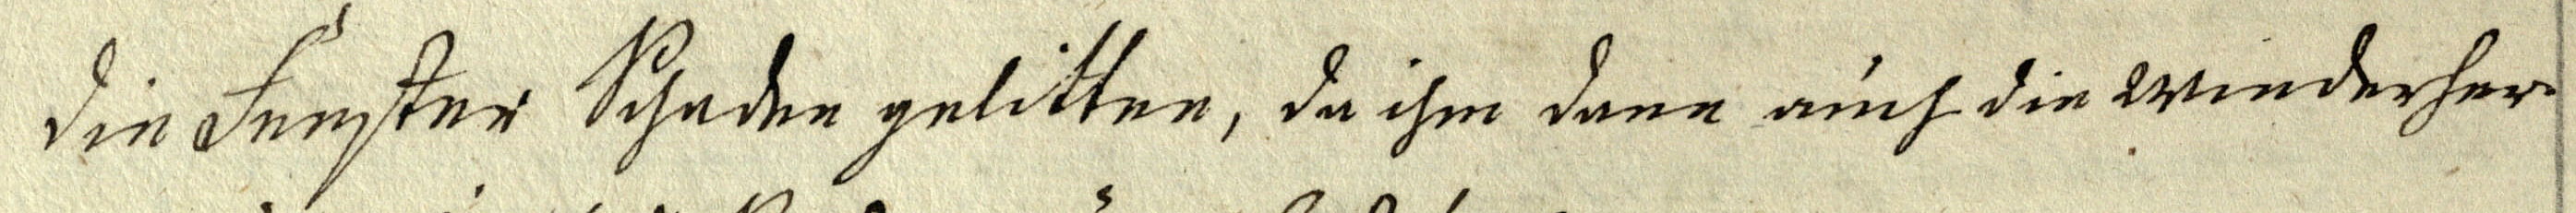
die Fenster Schaden gelitten, da ihm dann auch die Wiederher¬
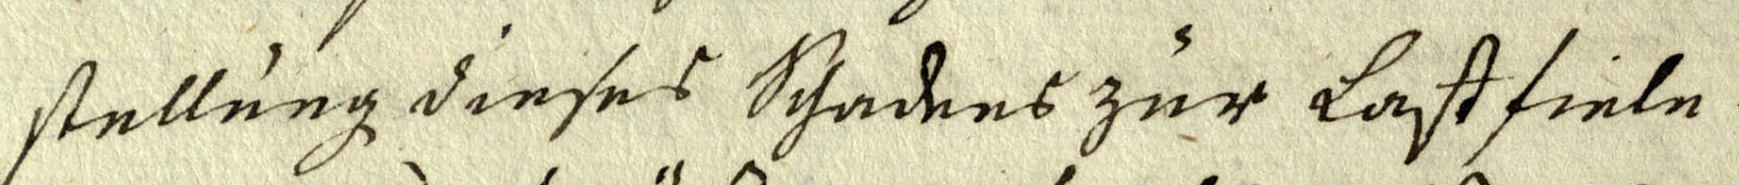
stellung dieses Schadens zur Last fiele.
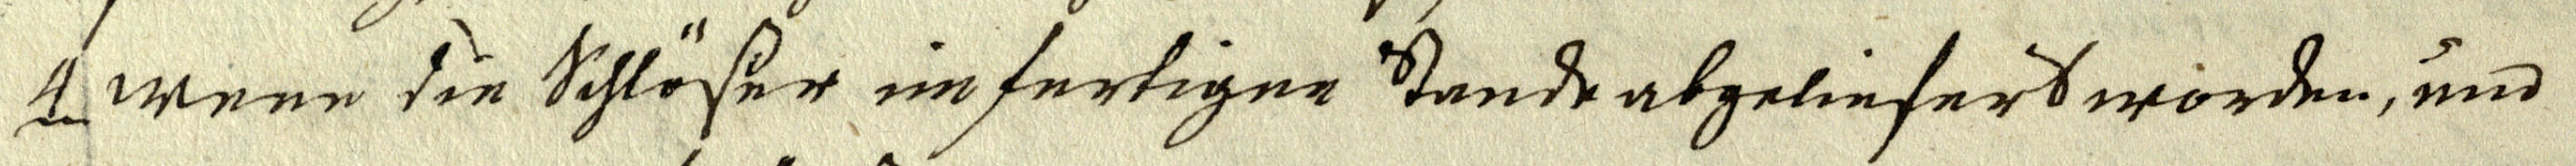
4. Wenn die Schlößer im fertigen Stande abgeliefert worden, und
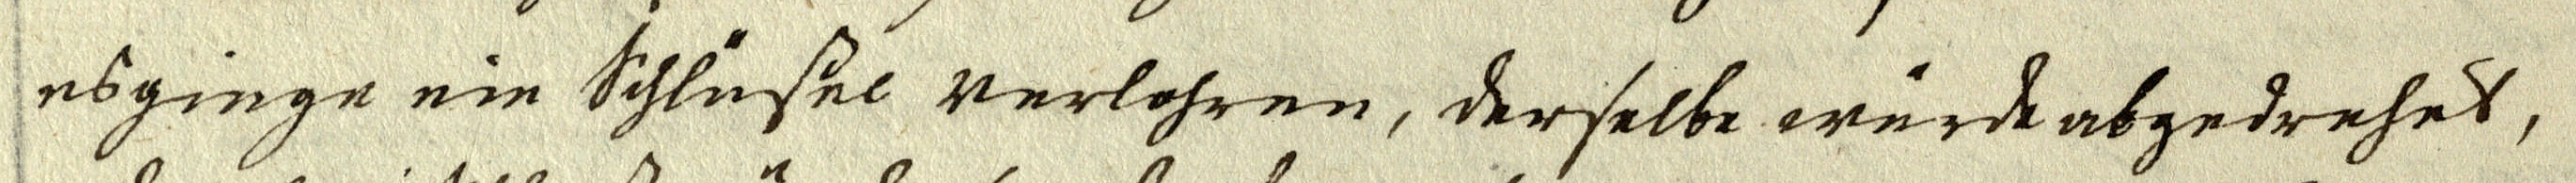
es ginge ein Schlüßel verlohren, derselbe würde abgedrehet,
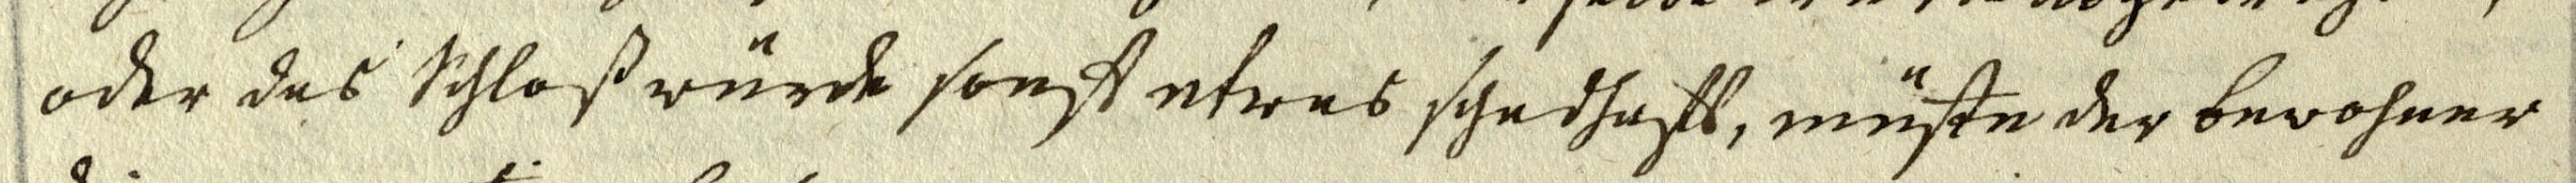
oder das Schloß würde sonst etwas schadhaft, müste der Bewohner
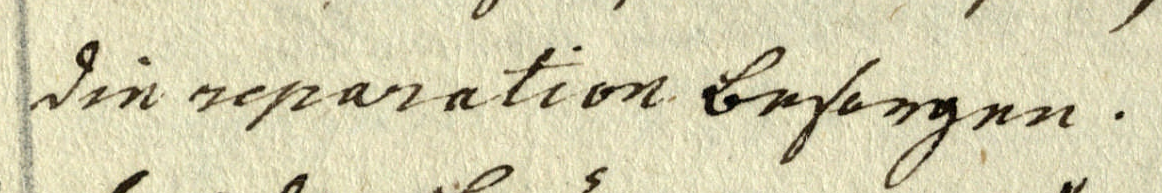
die reparation besorgen.
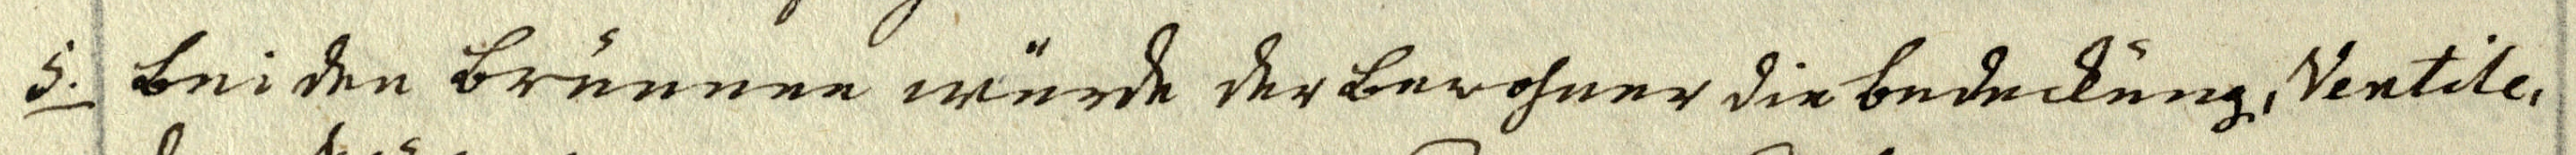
5. Bei den Brunnen würde der Bewohner die Bedeckung, Ventile,
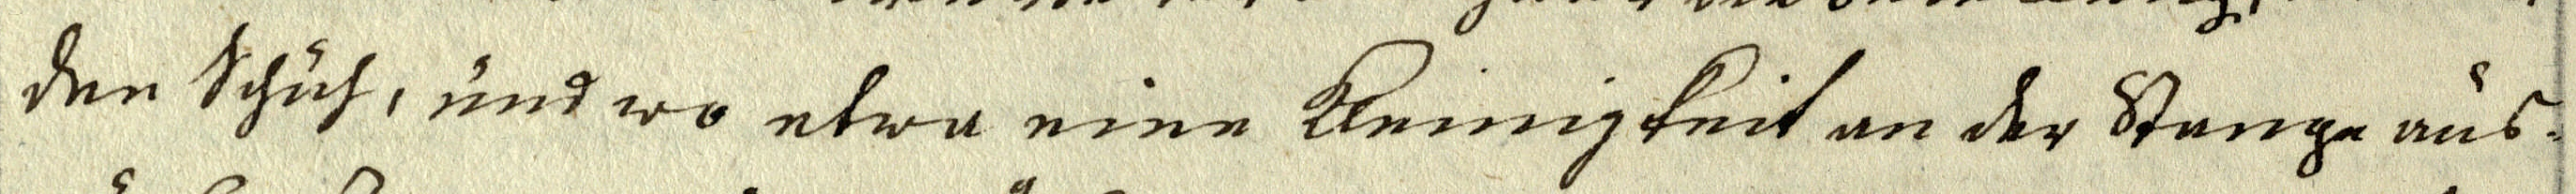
den Schuh,und wo etwa eine Kleinigkeit an der Stange aus¬
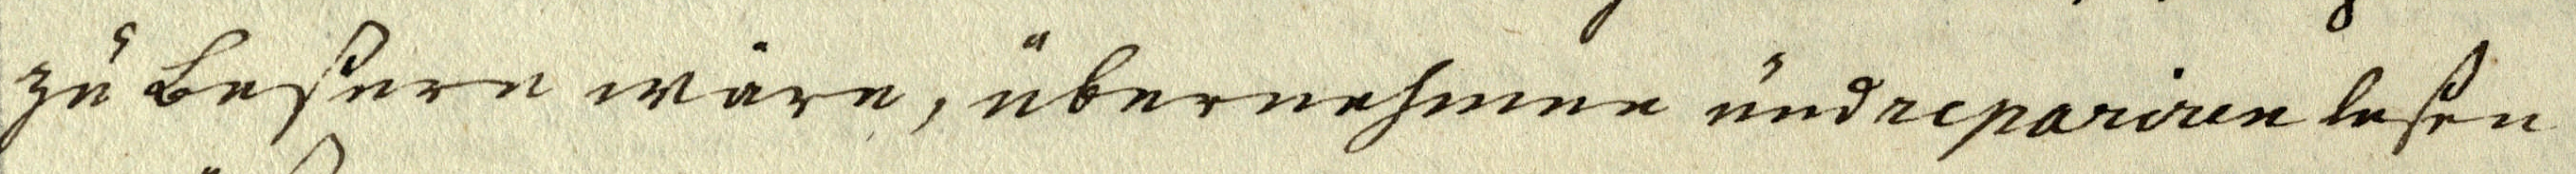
zubeßern wäre, übernehmen und repariren laßen
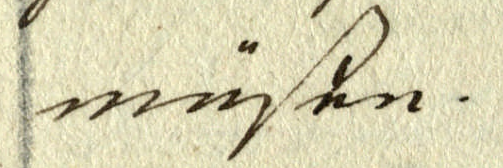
müßen.
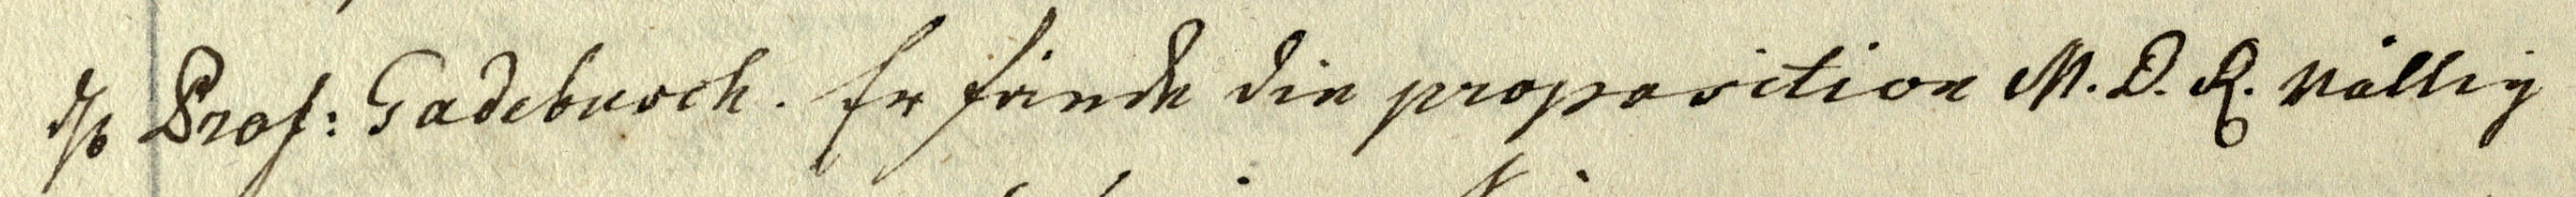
dh. Prof. Gadebusch. Er fände die proposition M. D. R. völlig
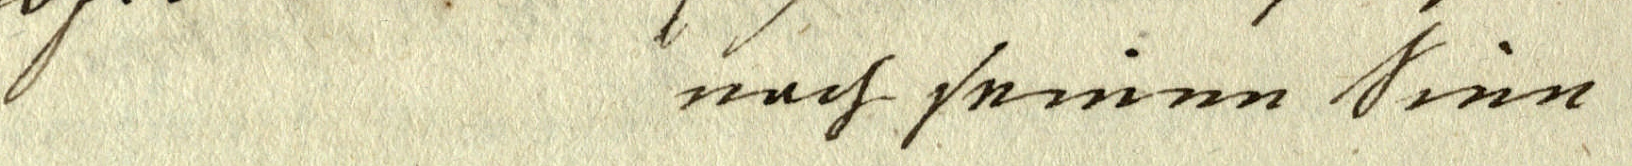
nach seinem Sinn.
